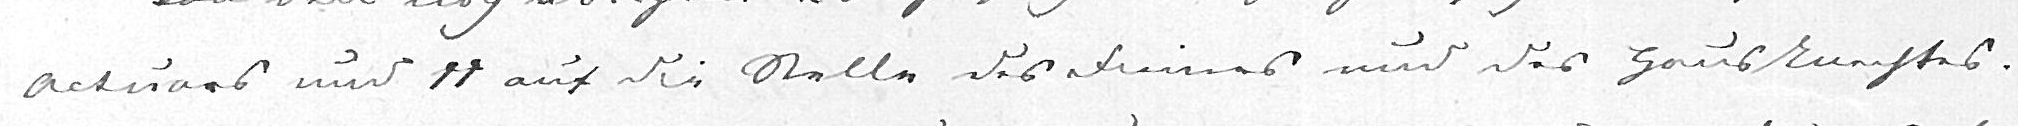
Actuars und 11 auf die Stelle des Dieners und des Hausknechtes.
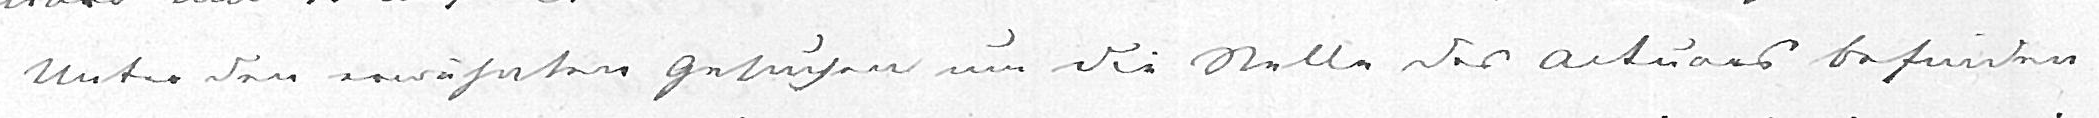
Unter den erwähnten Gesuchen um die Stelle des Actuars befinden
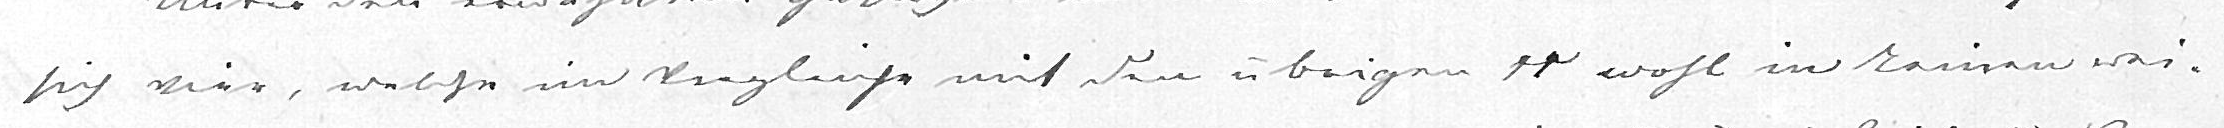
sich vier, welche im Vergleiche mit den übrigen 11 wohl in keinen wei-
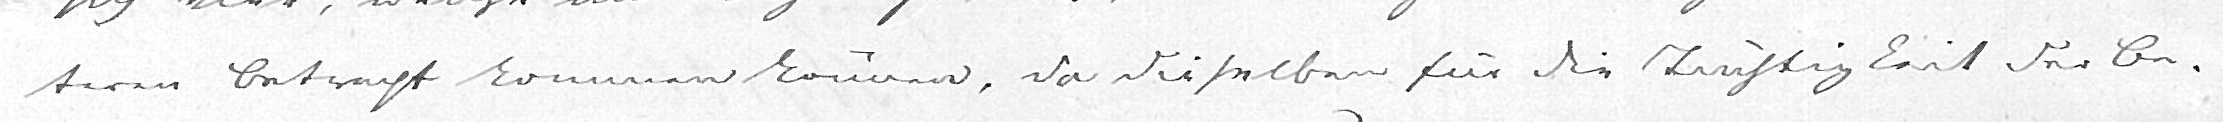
teren Betracht kommen können, da dieselben für die Tüchtigkeit der Be-
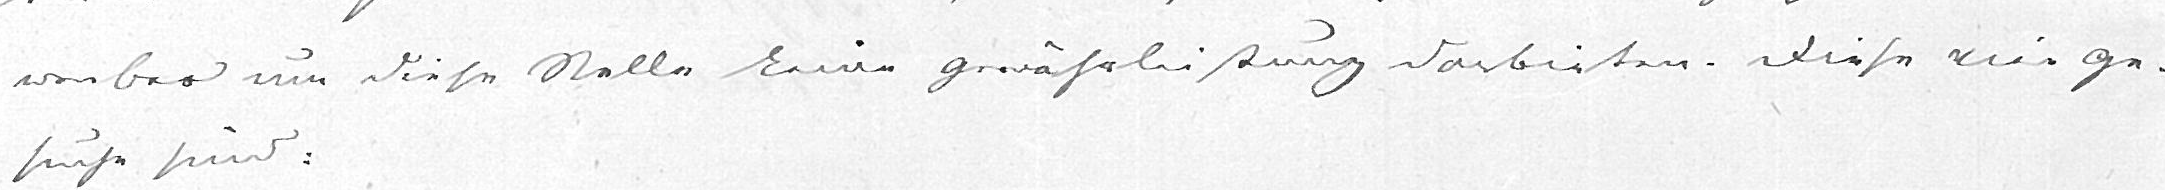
werber um diese Stelle keine Gewährleistung darbieten. Diese vier Ge-
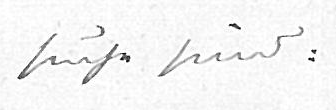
suche sind:
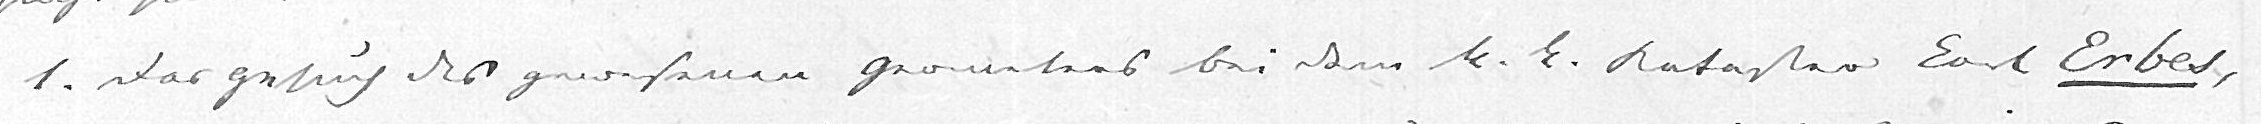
1. Das Gesuch des gewesenen Geometers bei dem k.k. Kattaster Carl Erbes,
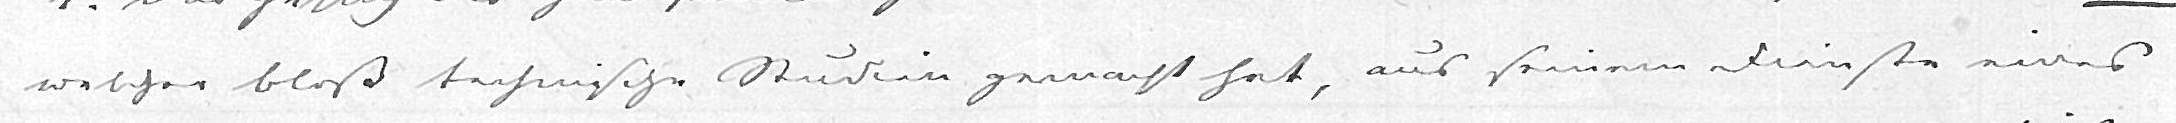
welcher bloß technische Studien gemacht hat, aus seinem Dienste eines
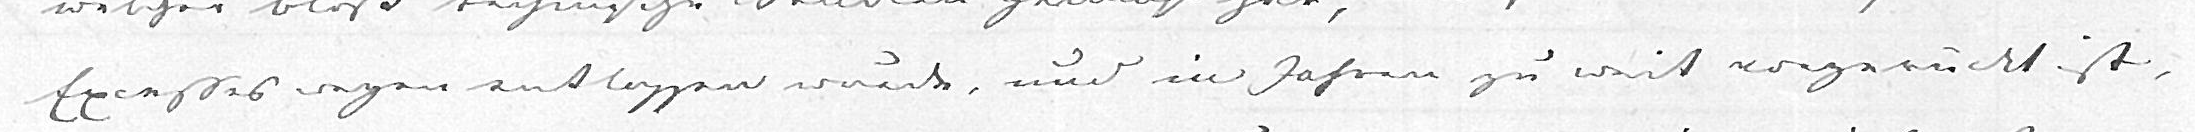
Excesses wegen entlassen wurde, und in Jahren zu weit vorgerückt ist,
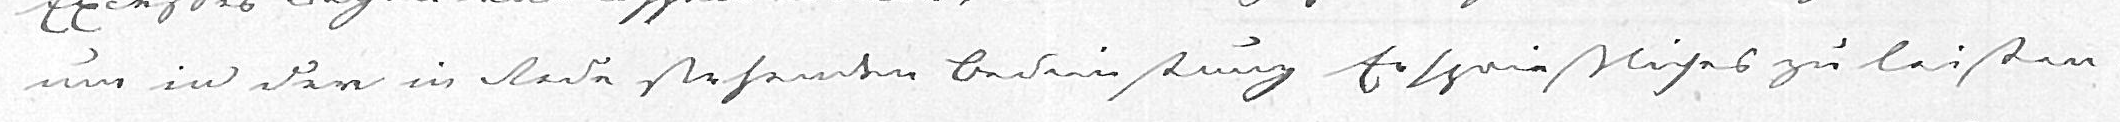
um in der in Rede stehenden Bedienstung Ersprießliches zu leisten.
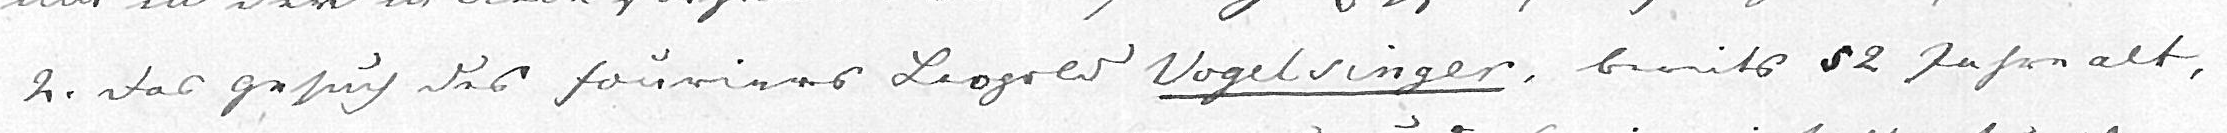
2. Das Gesuch des Fourniers Leopold Vogelsinger, bereits 52 Jahre alt,
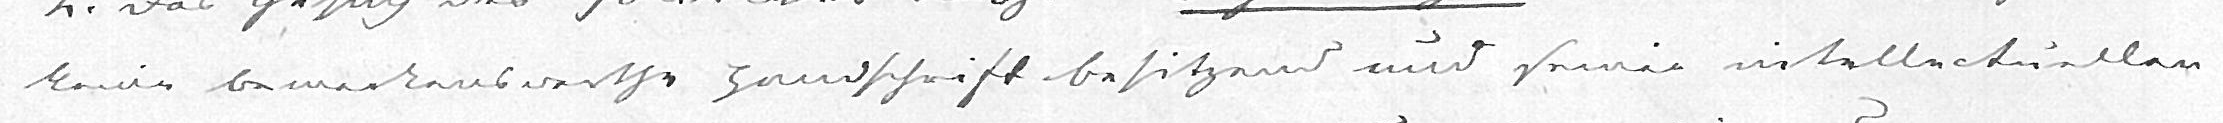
keine bemerkenswerte Handschrift besitzend und seine intellectuellen
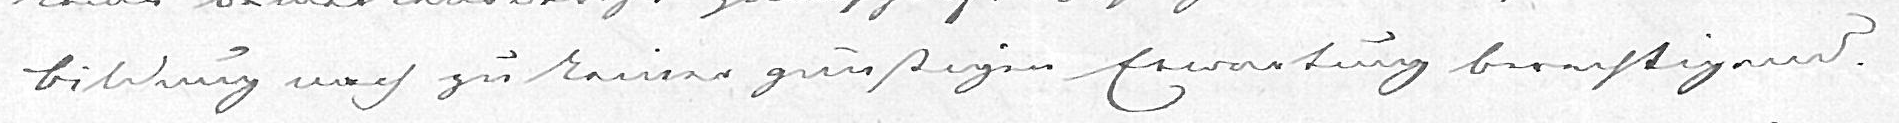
Bildung nach zu keiner günstigen Erwartung berechtigend.
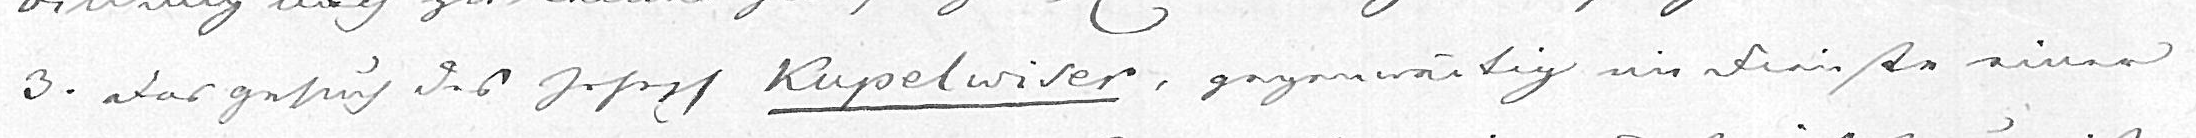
3. Das Gesuch des Joseph Kupelwiser, gegenwärtig im Dienste einer
